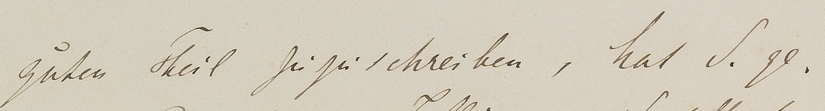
guten Theil zuzuschreiben, hat S. ge-
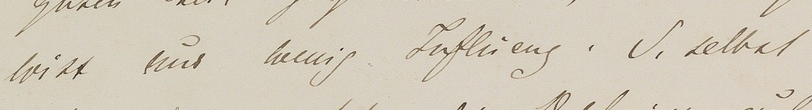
wiss nur wenig Influenz. S. selbst
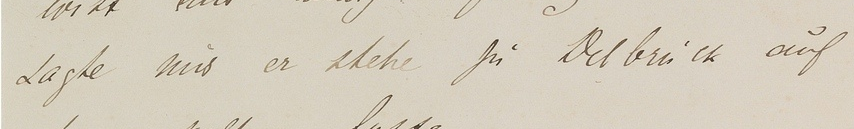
sagte mir er stehe zu Delbrück auf
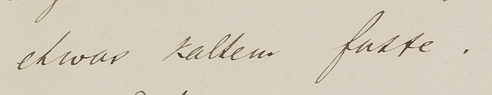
etwas kaltem Fusse.
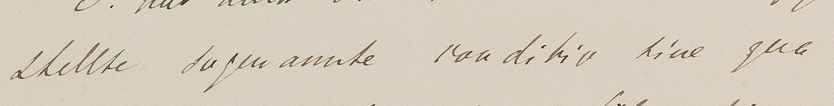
stellte sogenannte conditio sine qua
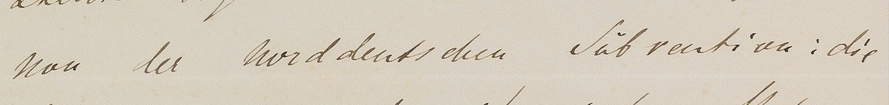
non der norddeutschen Subvention: die
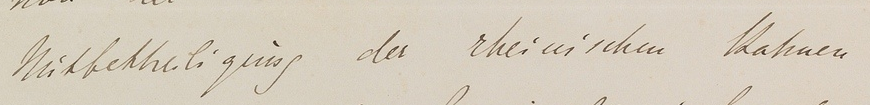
Mitbetheiligung der rheinischen Bahnen
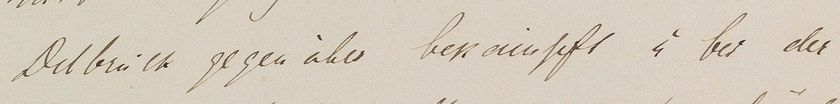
Delbrück gegenüber bekämpft u bei der
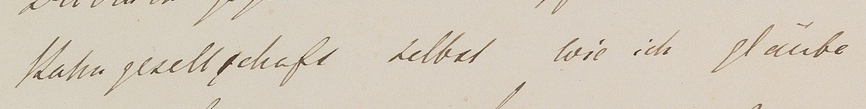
Bahngesellschaft selbst wie ich glaube
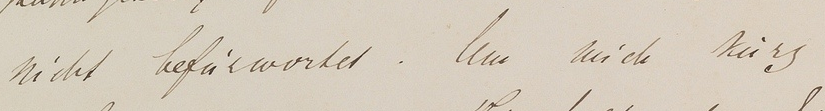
nicht befürwortet. Um mich kurz
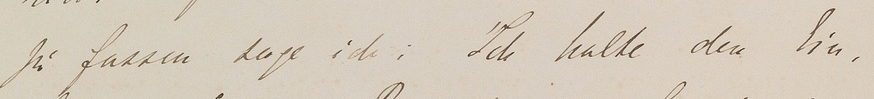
zu fassen sage ich: Ich halte den Ein-
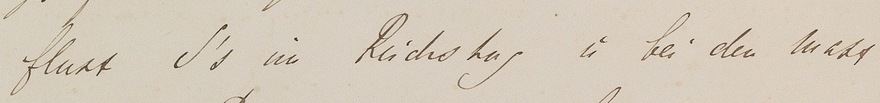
fluss S's im Reichstag u bei den mass-
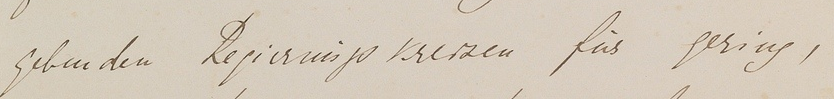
gebenden Regierungskreisen für gering,
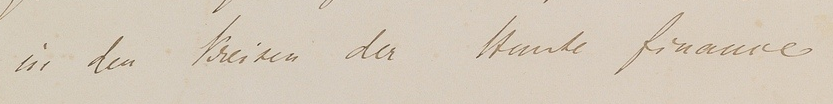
in den Kreisen der haute finance
